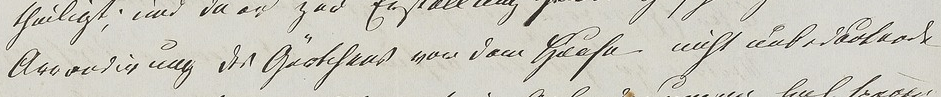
Arrondirung des Gärtchens vor dem Hause nicht unbedeutende
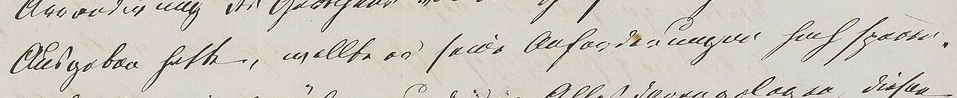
Ausgaben hatte, wollte er seine Anforderungen hoch spannen.
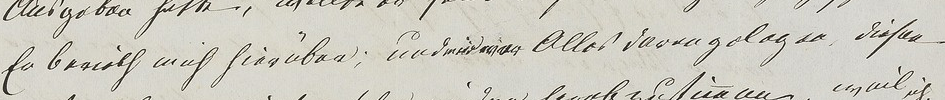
Er berieth mich hierüber; und mir war Alles daran gelegen, diesen
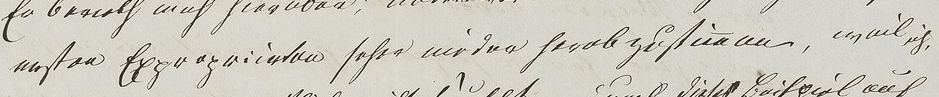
ersten Expropriirten seher nieder herabzustimmen, weil ich,
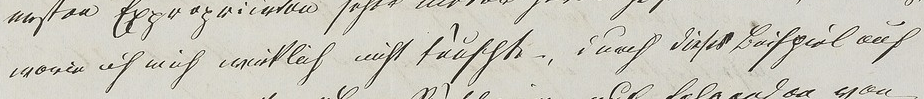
worin ich mich wirklich nicht täuschte, durch dieses Beispiel auf
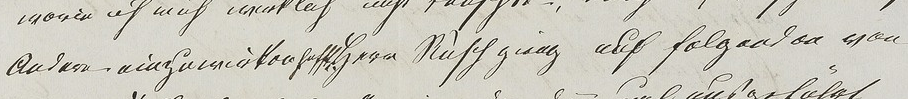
Andere einzuwirken hoffte. Herr Rüsch ging auf folgenden von
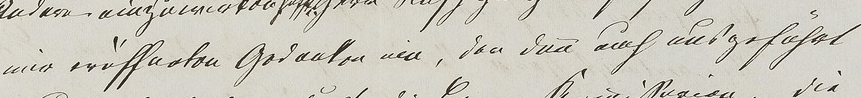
mir eröffneten Gedanken ein, der dann auch ausgeführt
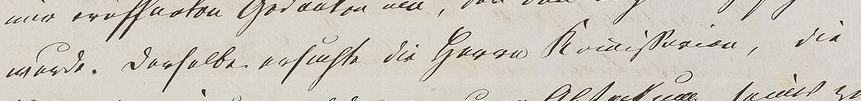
wurde. Derselbe ersuchte die Herrn Kommisarien, die
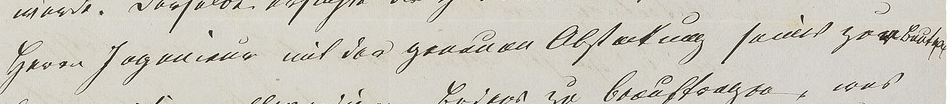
Herrn Ingenieur mit der genauen Absteckung seines zur Baute
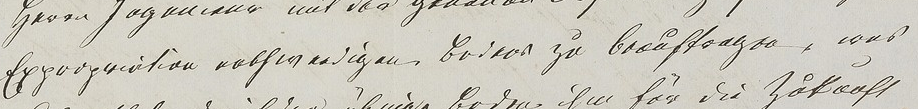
Expropriation nothwendigen Bodens zu beauftragen, was
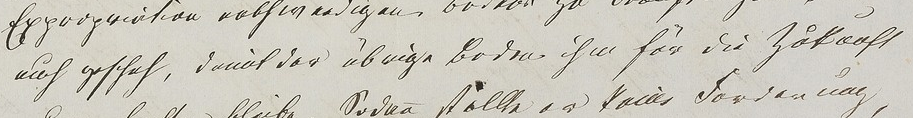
auch geschah, damit der übrige Boden ihm für die Zukunft
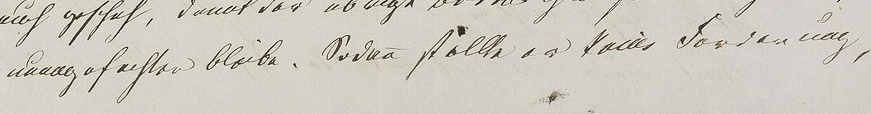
unangefochten bleibe. Sodann stellte er keine Forderung,
